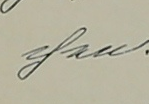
chen.
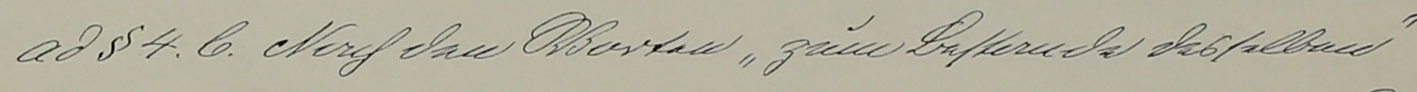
ad § 4. b. Nach den Worten „zum Bestande desselben“
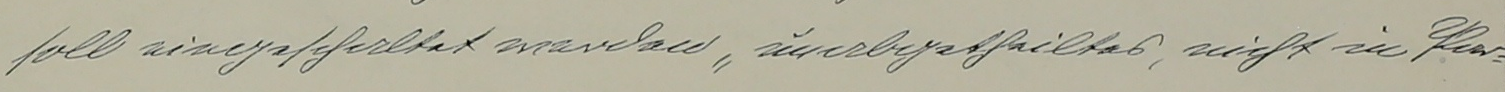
soll eingeschaltet werden „unabgetheiltes, nicht in Par-
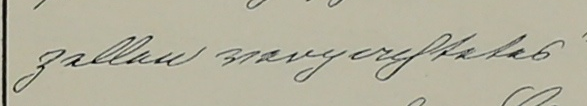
zellen verpachtetes“
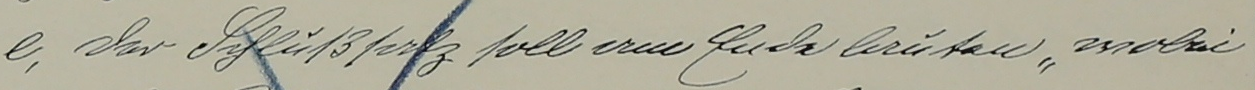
e. Der Schlußsatz soll am Ende lauten „wobei
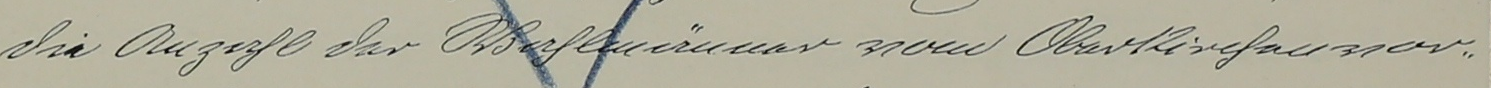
die Anzahl der Wahlmänner vom Oberkirchenvor-
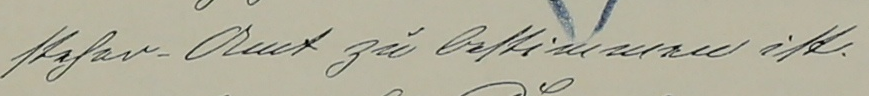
steher-Amt zu bestimmen ist“.
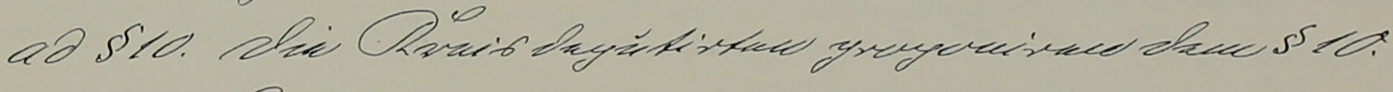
ad § 10. Die Kreisdeputirten proponiren dem § 10.
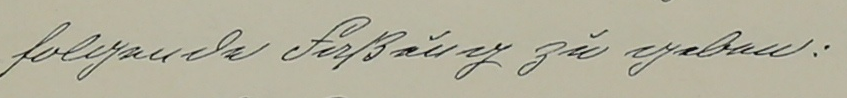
folgende Faßung zu geben:
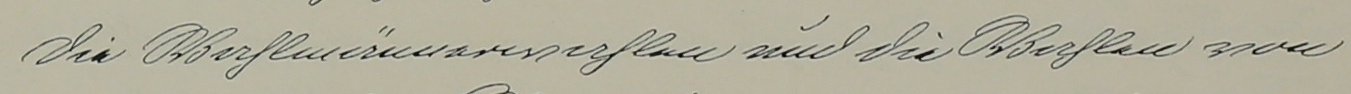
„Die Wahlmännerwahlen und die Wahlen von
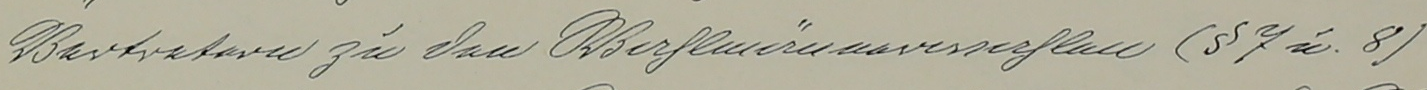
Vertretern zu den Wahlmännerwahlen (§ 7 u. 8)
